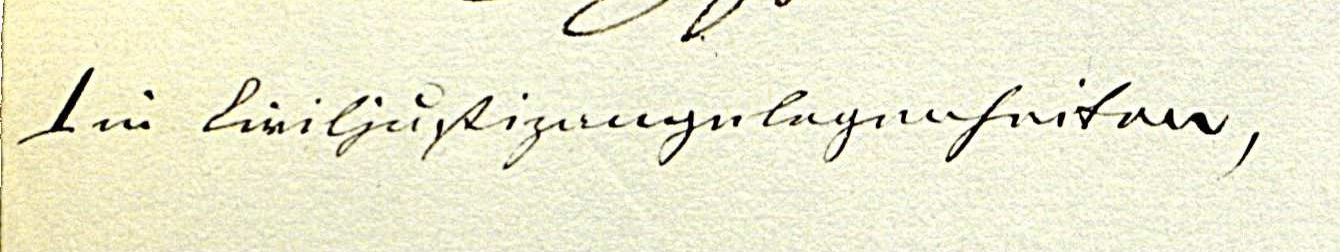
xx in Civiljustizangelegenheiten,
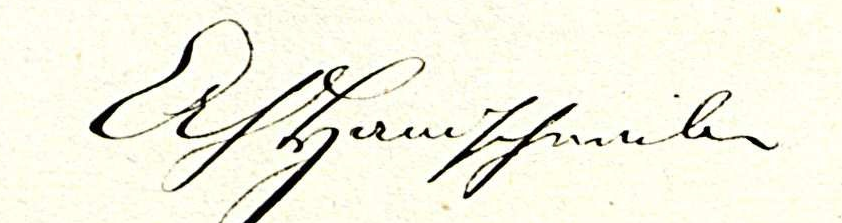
Ah Ham schreiben
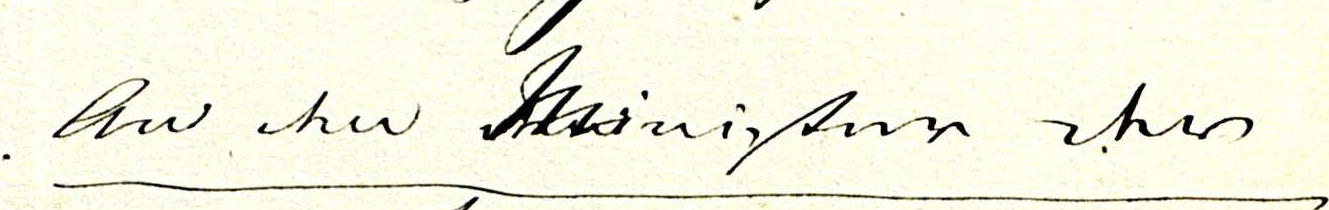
An den Minister der
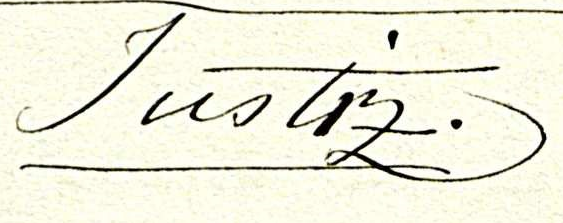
Justiz.
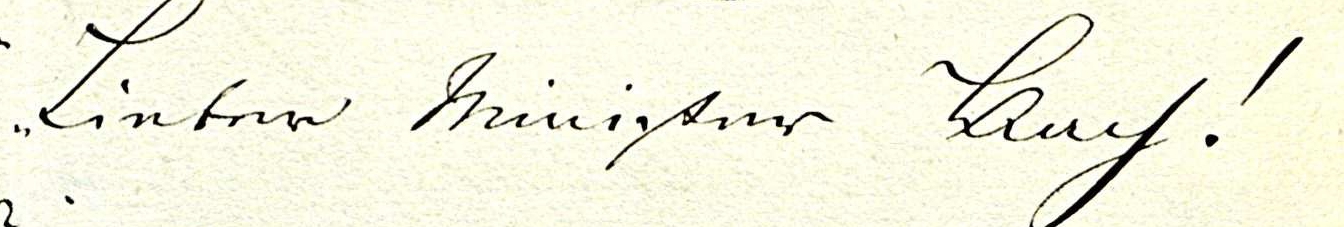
Lieber Minister Bach!
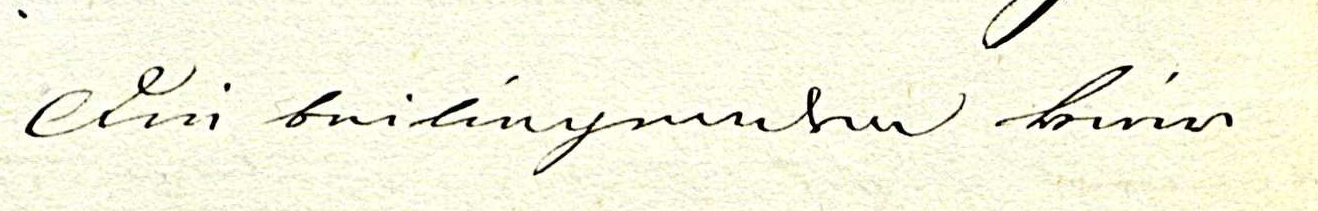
Die beiliegenden vier
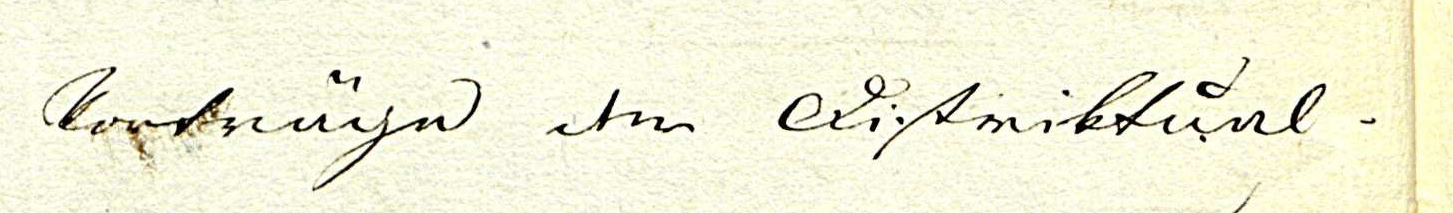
Vorträge der Distriktual¬
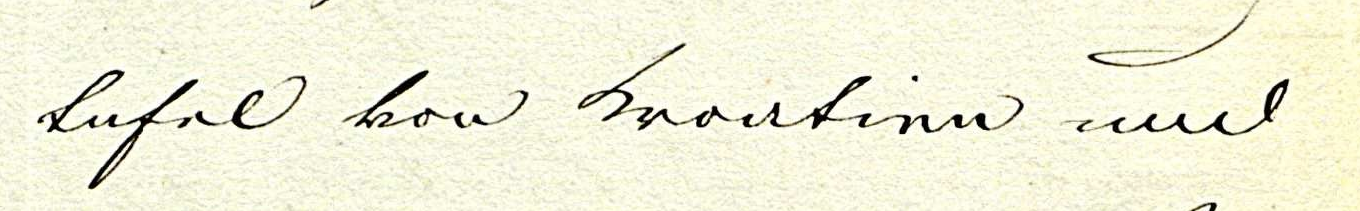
tafel von Kroatien und
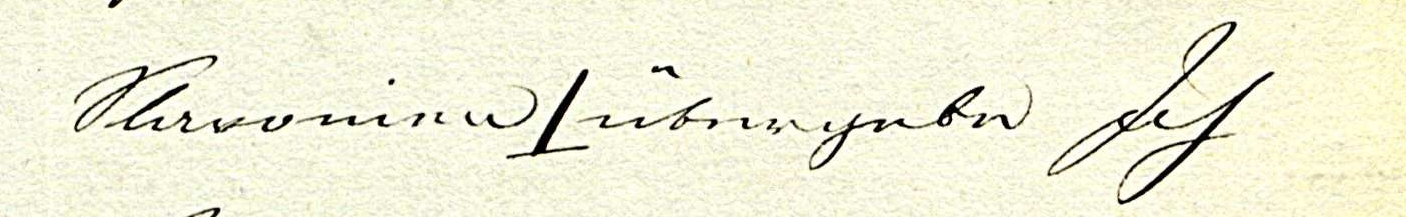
Slavonien xx übergebe Jch
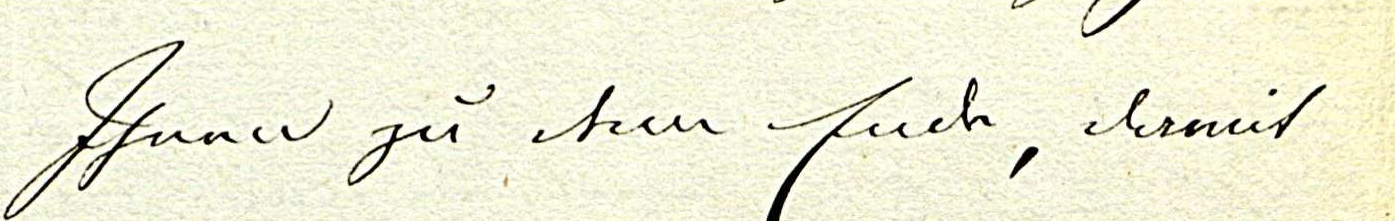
Jhnen zu den Ende, damit
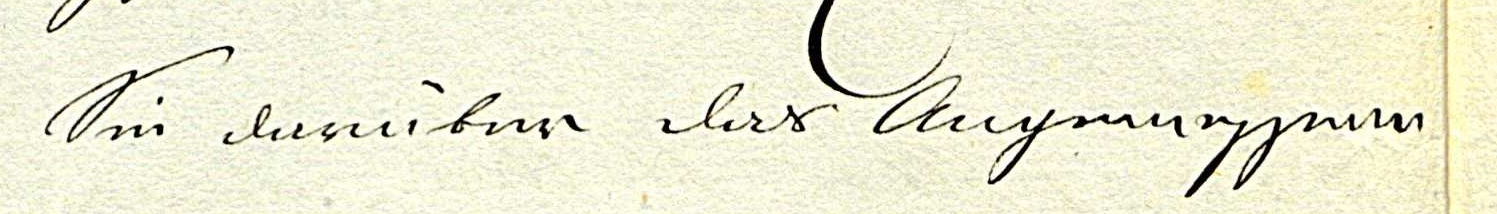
Sie darüber das Angemessene
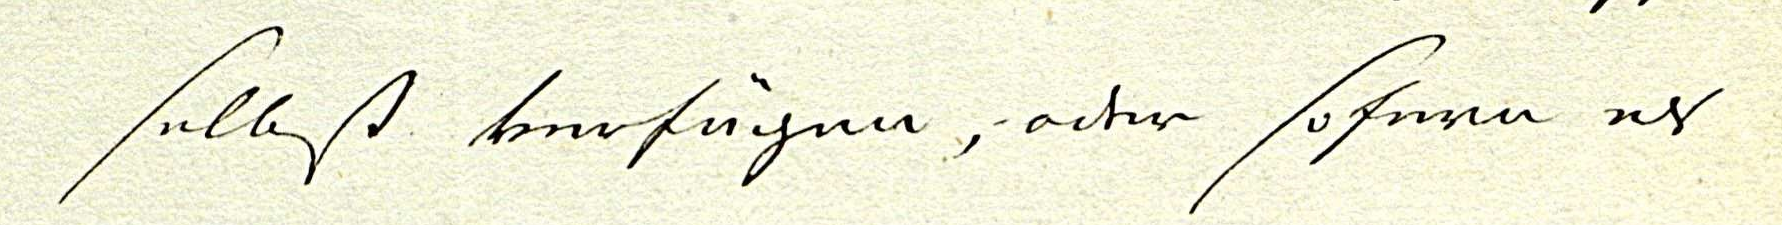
selbst verfügen, oder sofern er
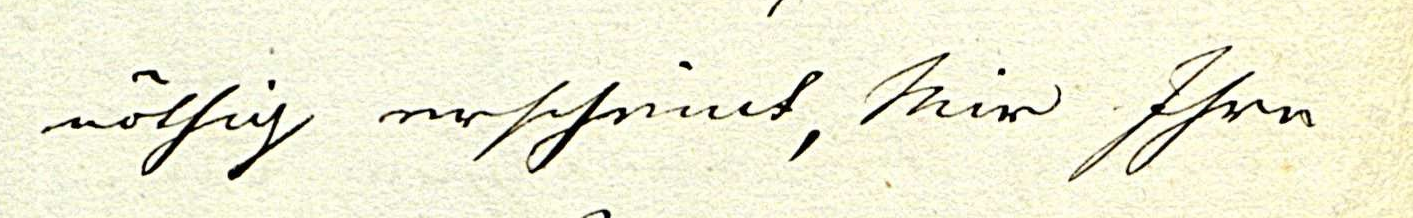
nöthig erschient, Mir Jhre
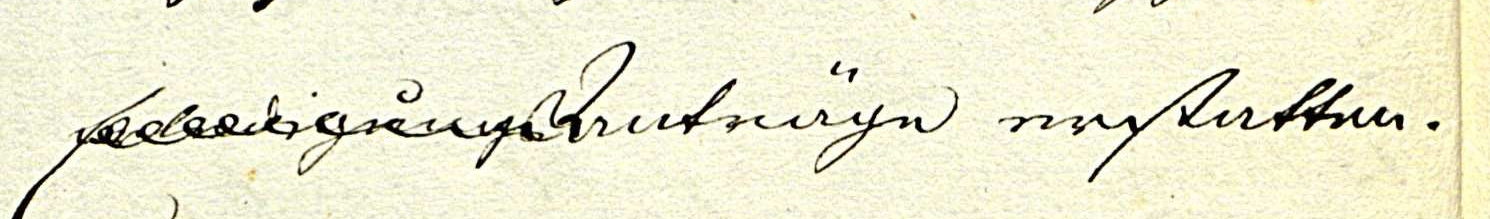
Anträge erstatten.
